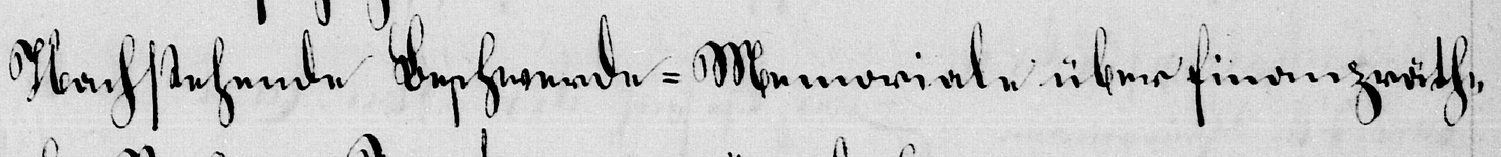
Nachstehende Beschwerde-Memoriale über finanzräth¬
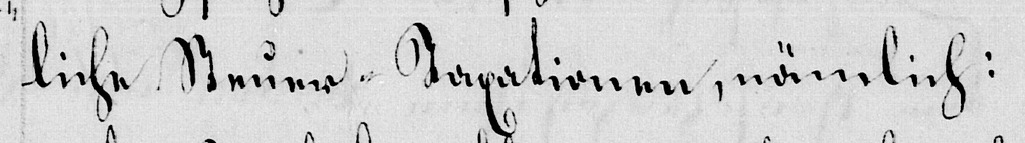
liche Steuer-Taxationen, nämlich:
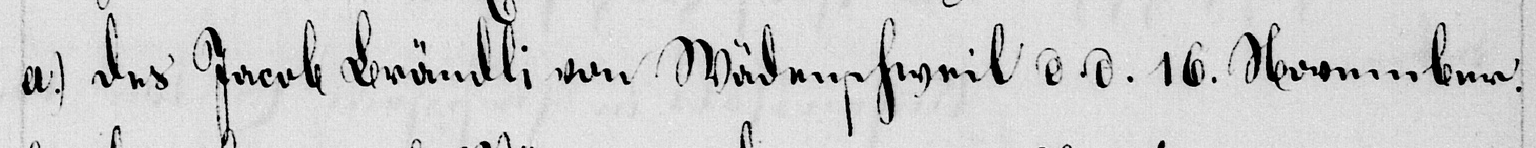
a.) des Jacob Brändli von Wädenschweil d. d. 16. November.
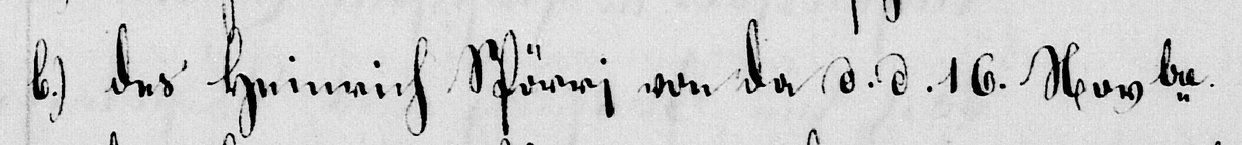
b.) des Heinrich Spörri von da d. d. 16. Novbre.
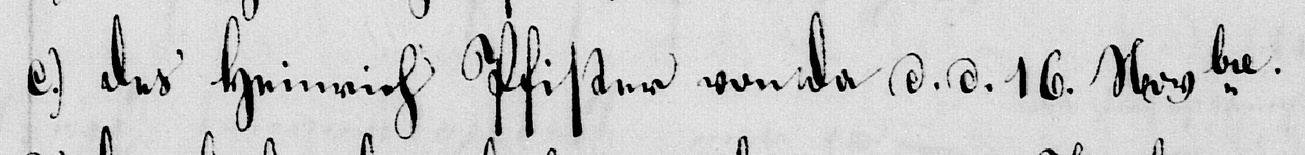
c.) des Heinrich Pfister von da d. d. 16. Novbre.
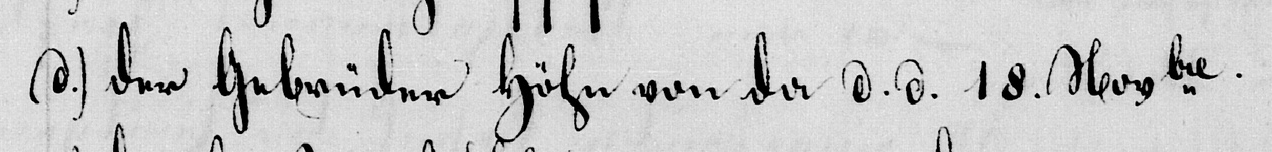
d.) der Gebrüder Höhn von da d. d. 18. Novbre.
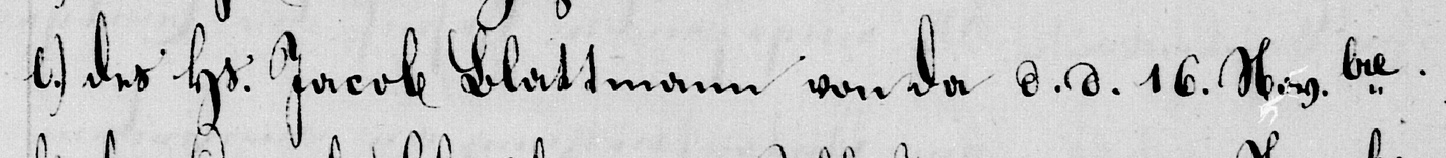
e.) des Hs. Jacob Blattmann von da d. d. 16. Novbre.
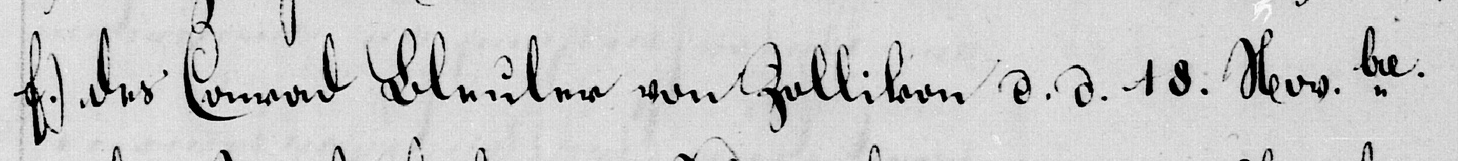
f.) des Conrad Bleuler von Zollikon d. d. 18. Novbre.
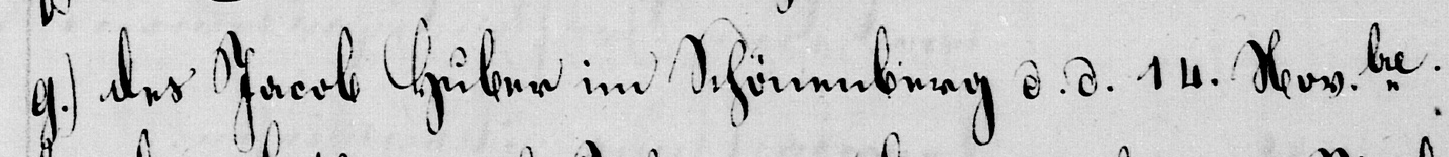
g.) des Jacob Huber in Schönenberg d. d. 14. Novbre.
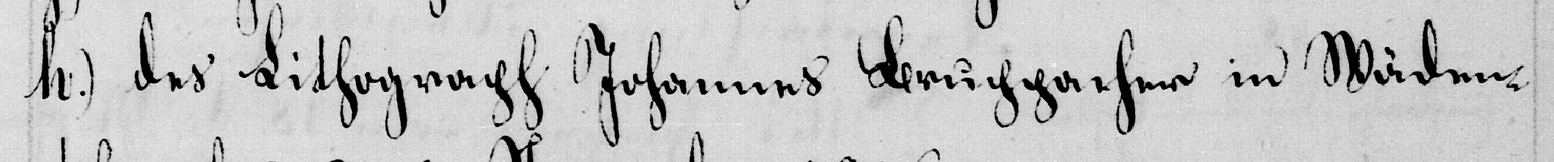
h.) des Lithograph Johannes Bruppacher in Wäden¬
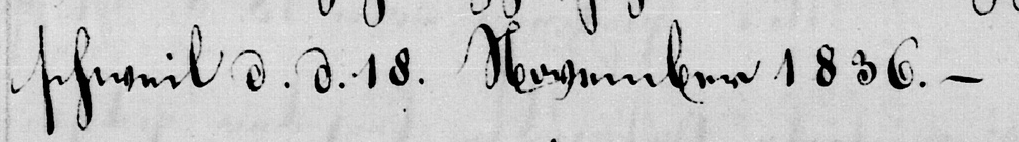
schweil d. d. 18. November 1836. –
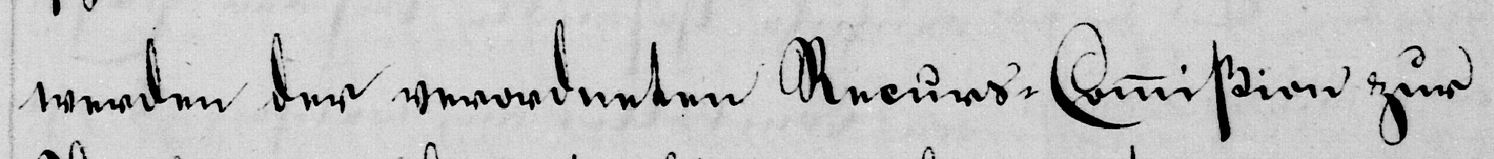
werden der verordneten Recurs-Commißion zur
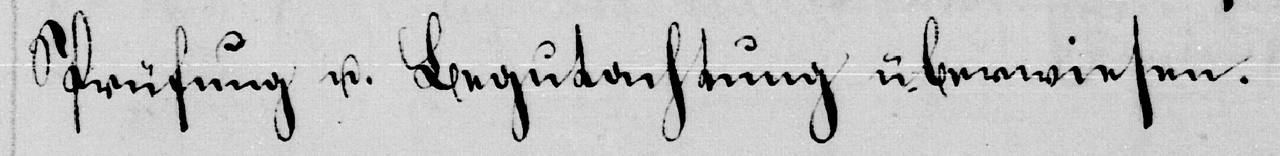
Prüfung u. Begutachtung überwiesen.
